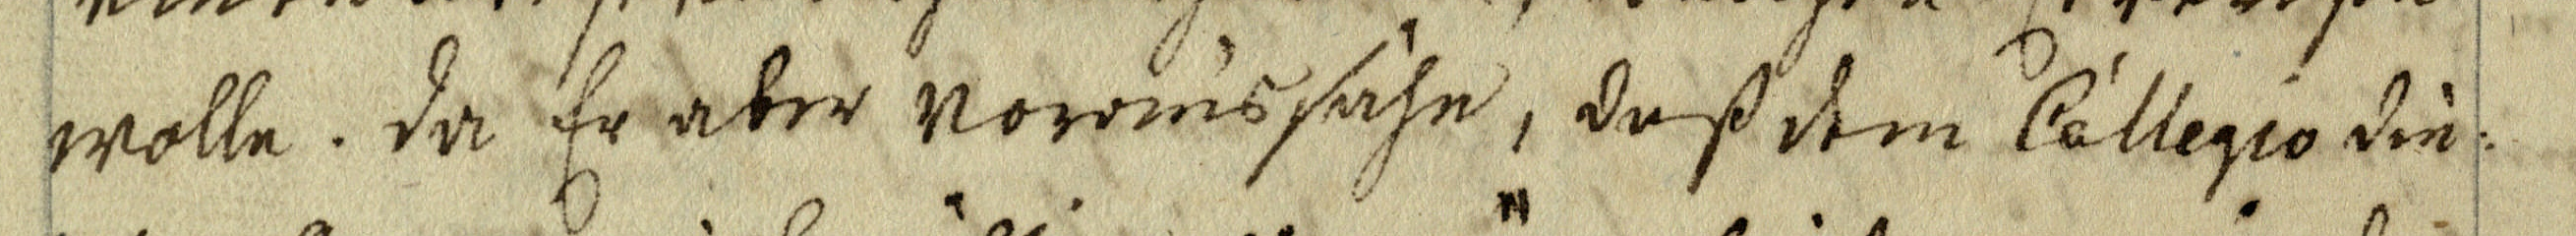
wolle. Da Er aber voraussähe, daß dem Collegio die¬
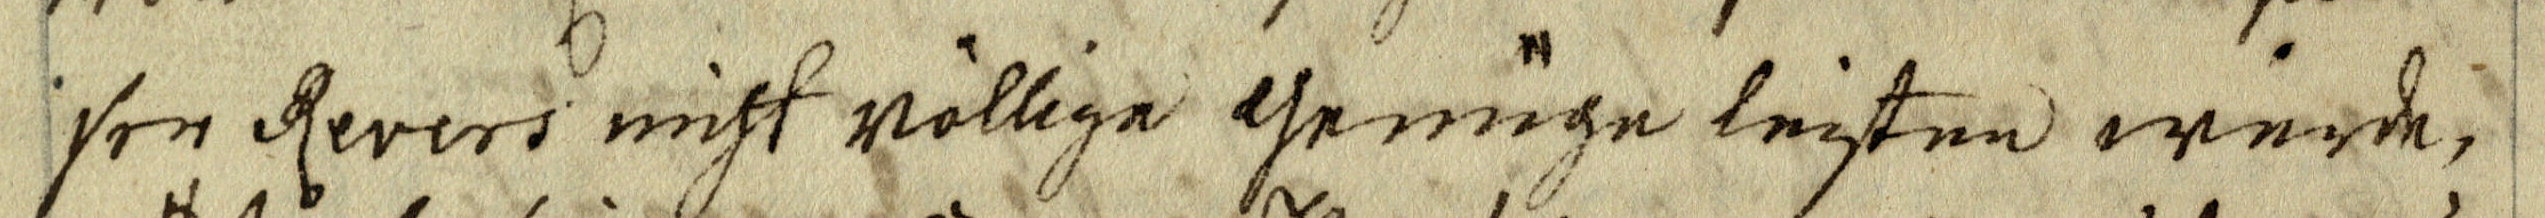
sen Revers nicht völlige Genüge leisten würde,
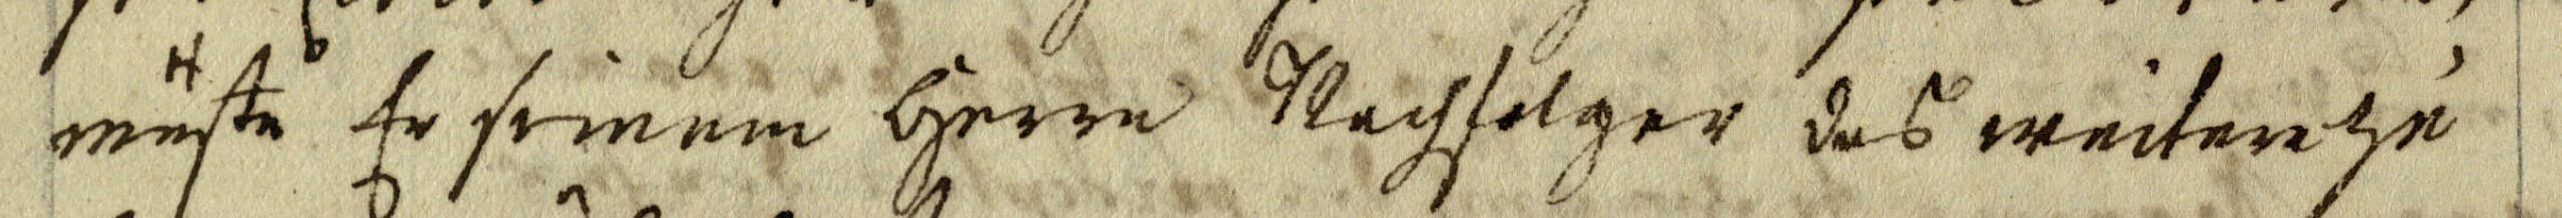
müste Er seinem Herrn Nachfolger das weitere zu
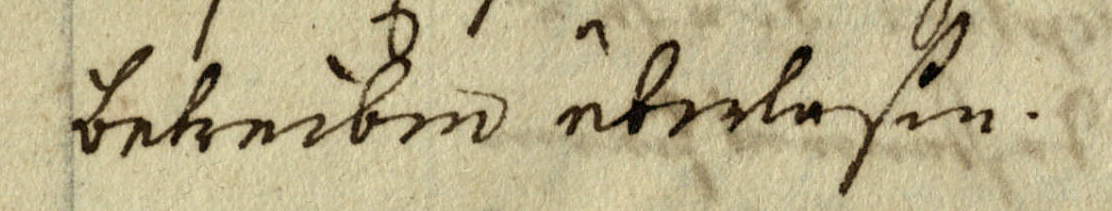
betreiben überlaßen.
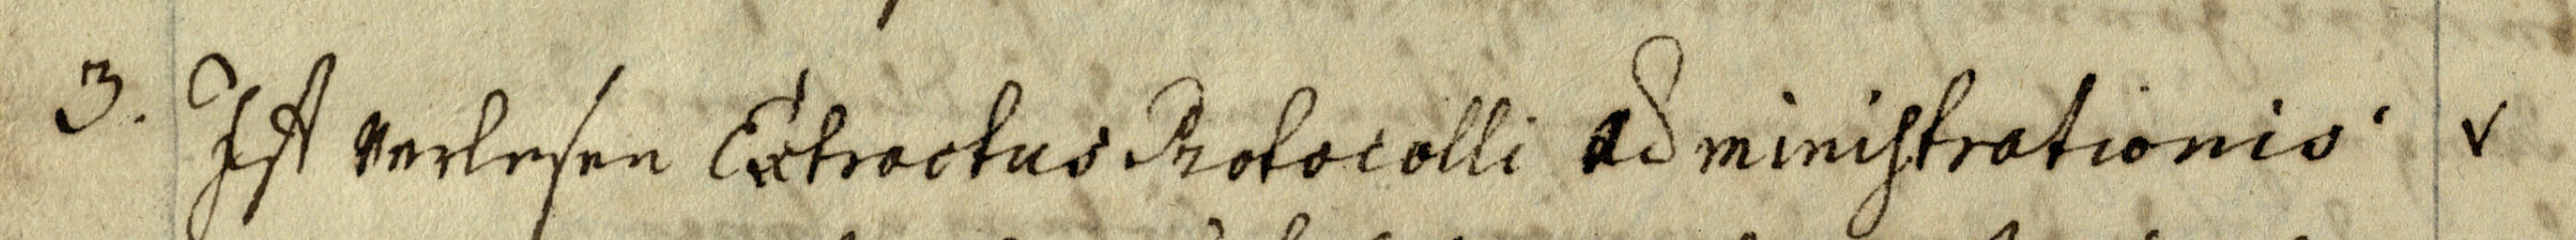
3. Ist verlesen Extractus Protocolli Administrationis
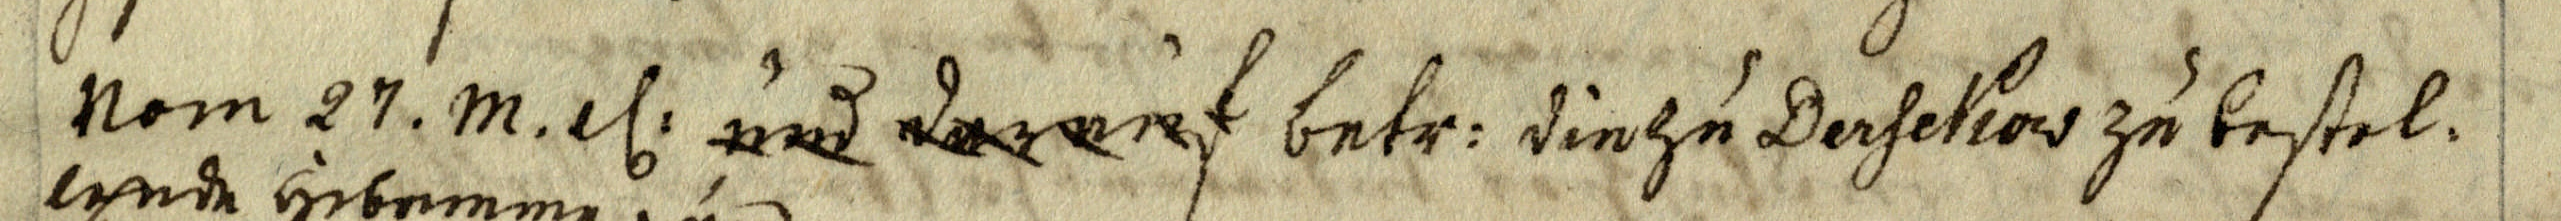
vom 27. M. el. betr. die zu Dersekow zu bestel¬
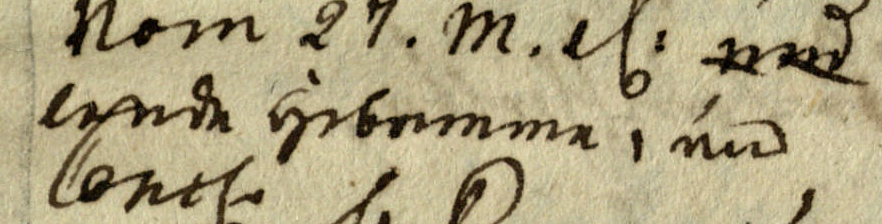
lende Hebamme und
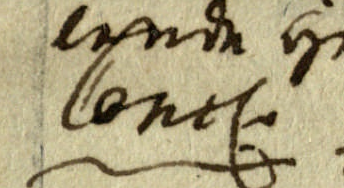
Concl.
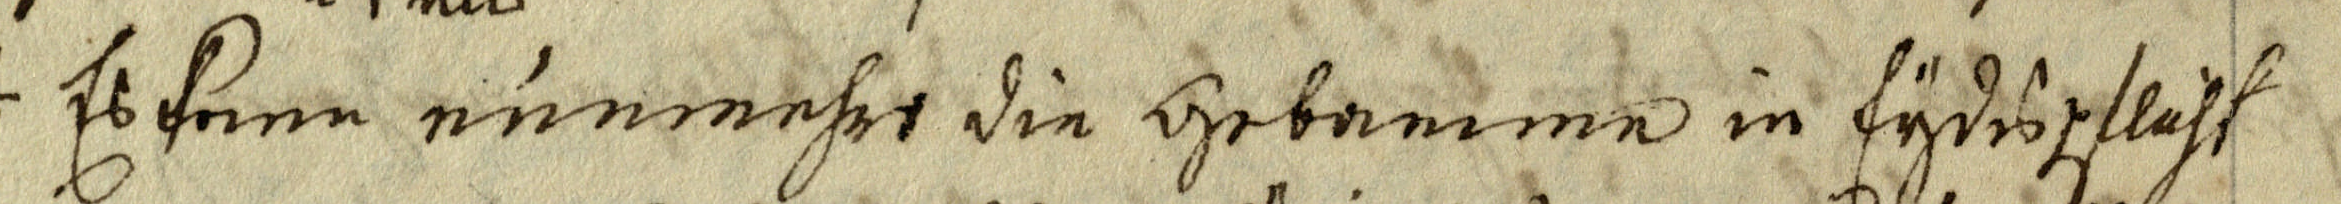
Es kann nunmehro die Hebamme in Eÿdespflicht
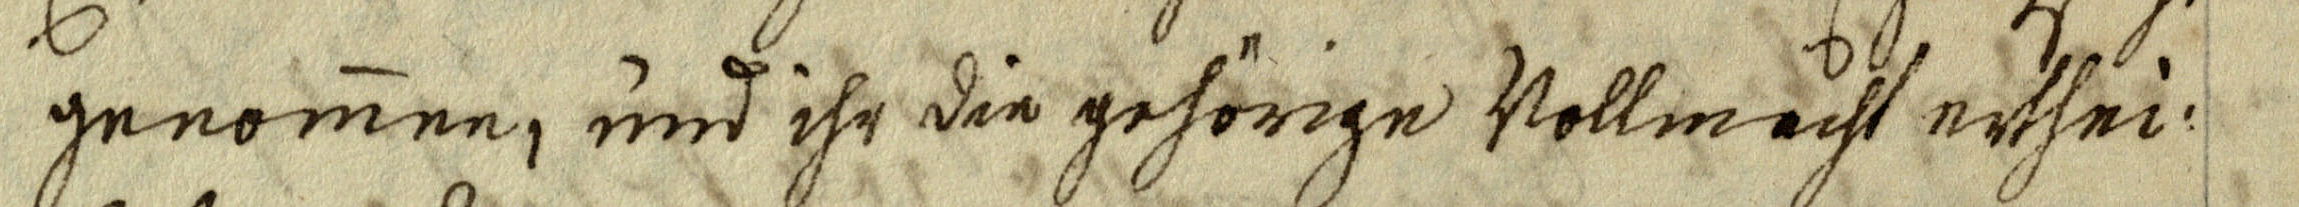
genomen, und ihr die gehörige Vollmacht erthei¬
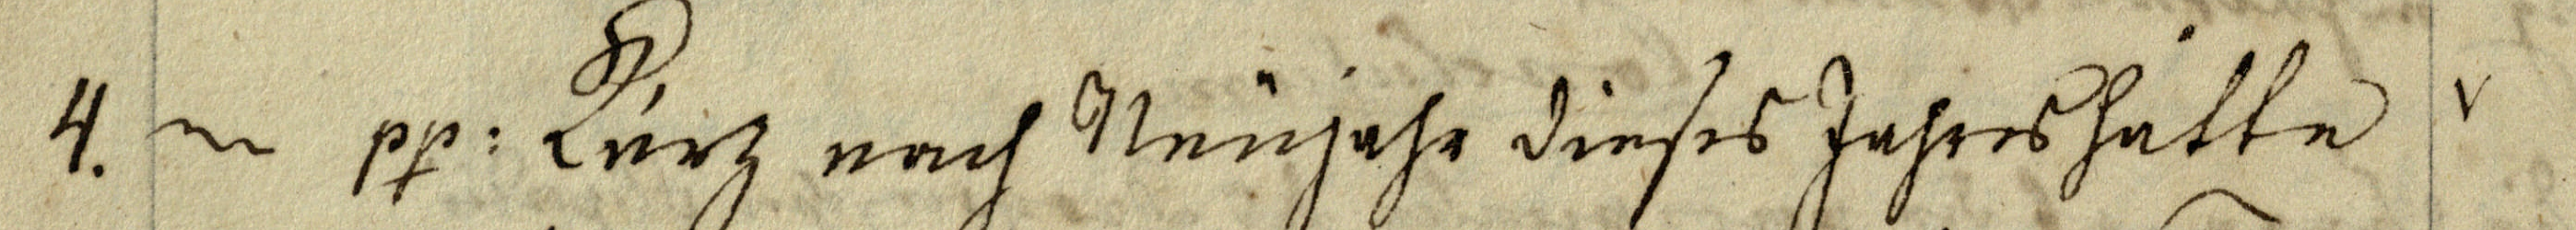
4. pp. Kurz nach Neujahr dieses Jahres hätte
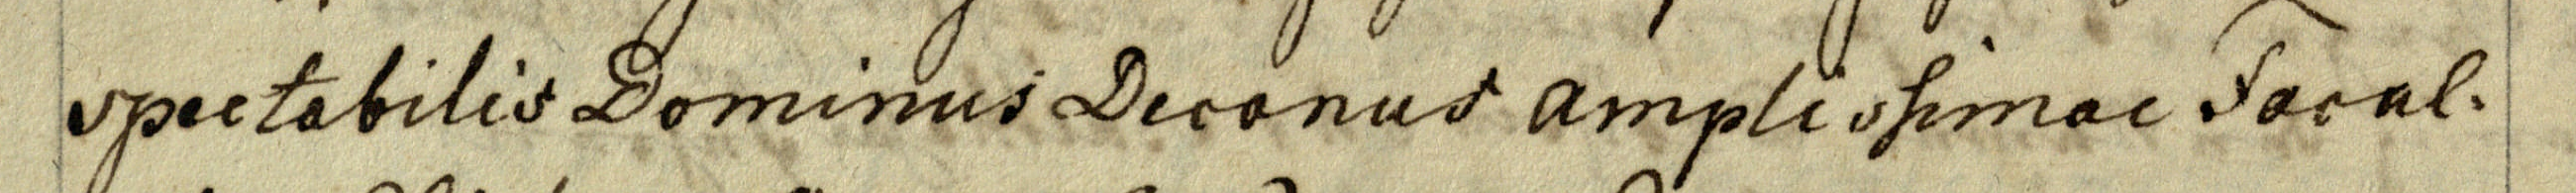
spectabilis Dominus Decanus Amplissimae Facul¬
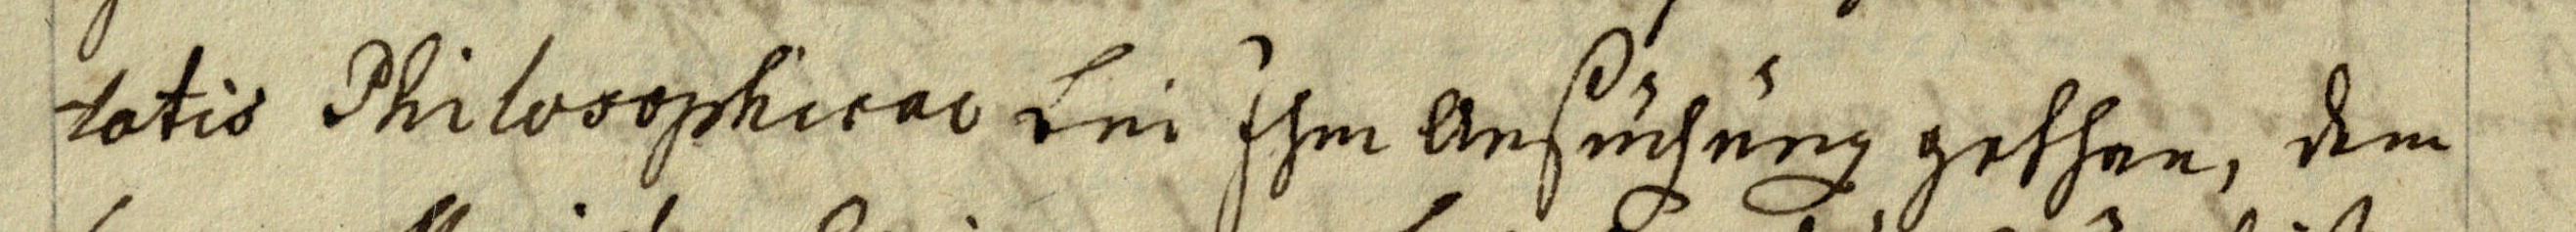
tatis Philosophicae bei Ihm Ansuchung gethan, dem
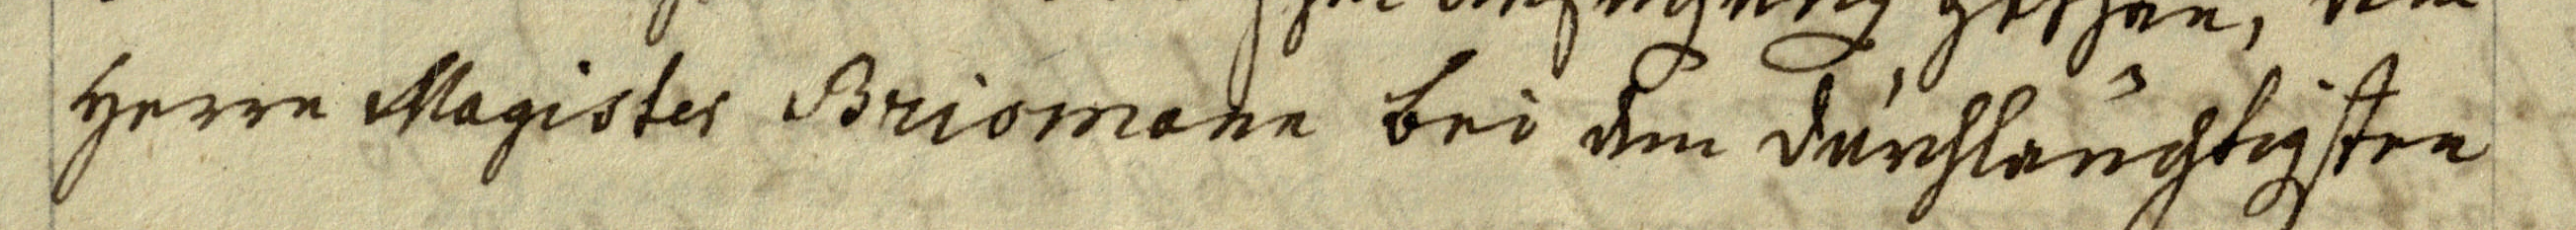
Herrn Magister Brismann bei dem Durchlauchtigsten
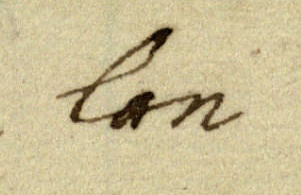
Can
